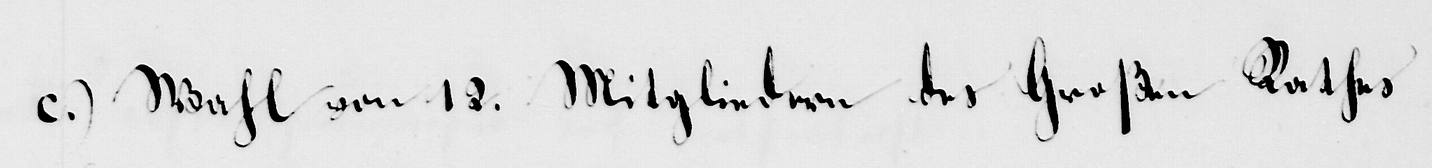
c.) Wahl von 12. Mitgliedern des Großen Rathes
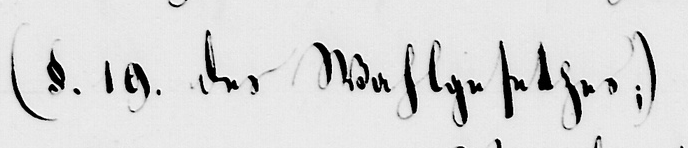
(§. 19. des Wahlgesetzes;)
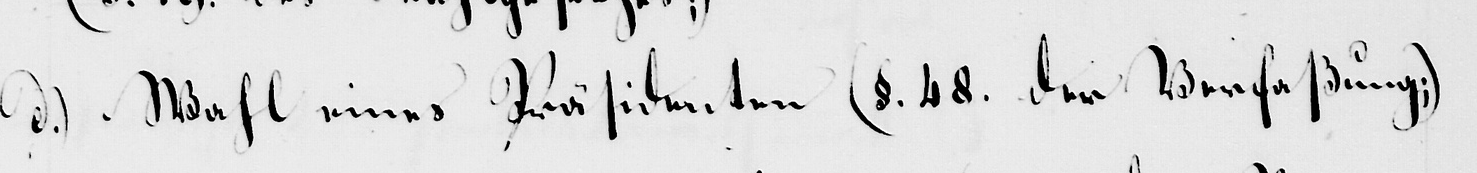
d.) Wahl eines Präsidenten (§. 48. der Verfaßung;)
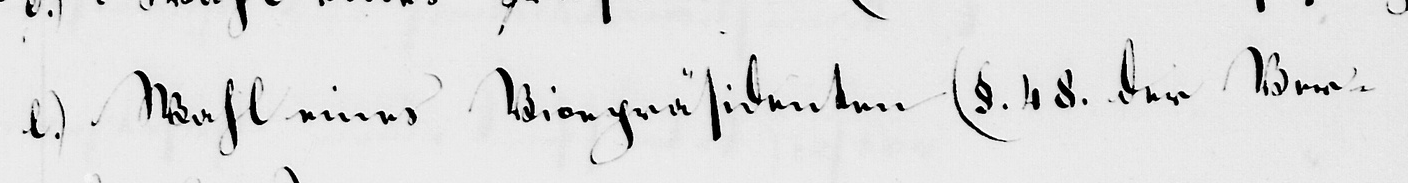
e.) Wahl eines Vicepräsidenten (§. 48. der Ver¬
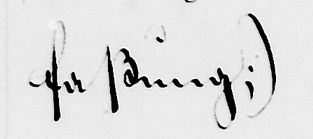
faßung;)
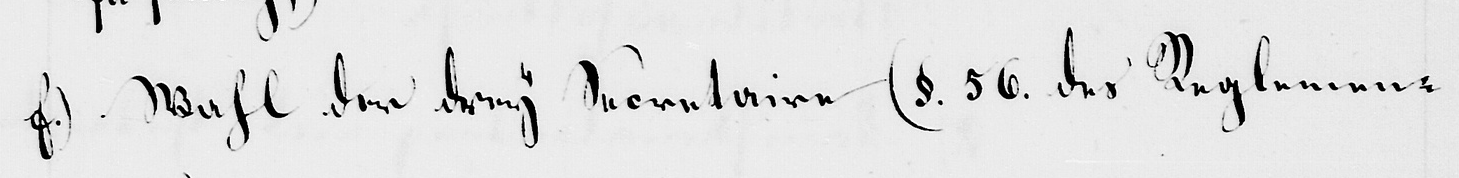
f.) Wahl der drey Secretaire (§. 56. des Reglemen¬
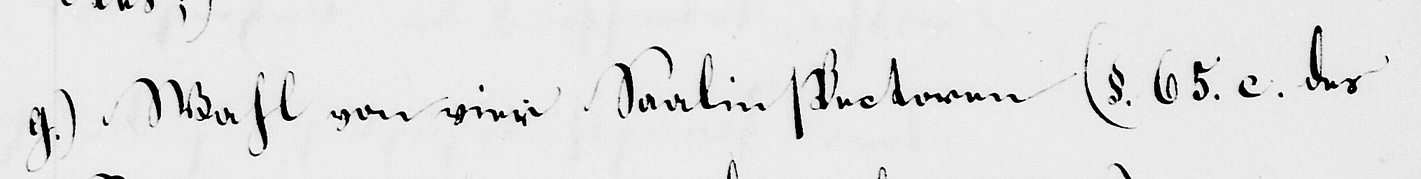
g.) Wahl von vier Saalinspectoren (§. 65. c. des
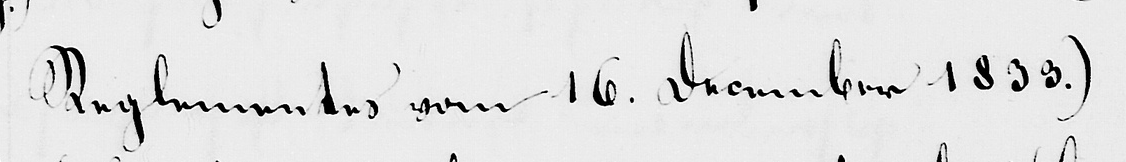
Reglementes vom 16. December 1833.)
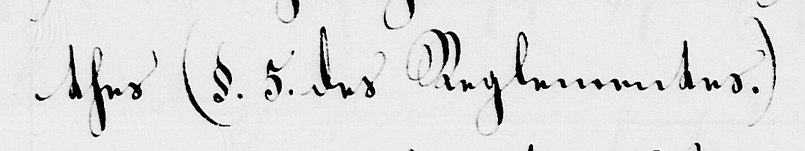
thes (§. 5. des Reglementes.)
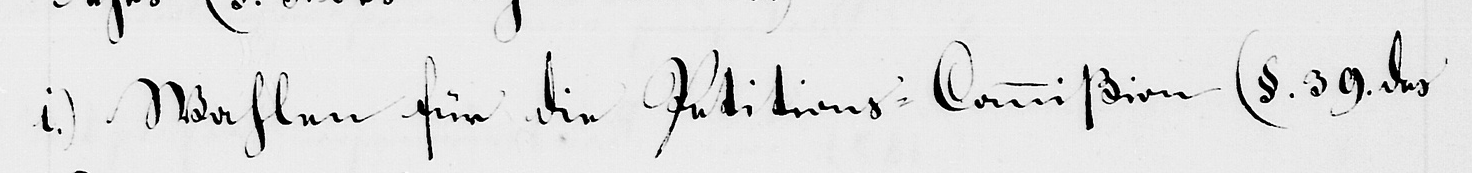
i.) Wahlen für die Petitions-Commißion (§. 39. des
